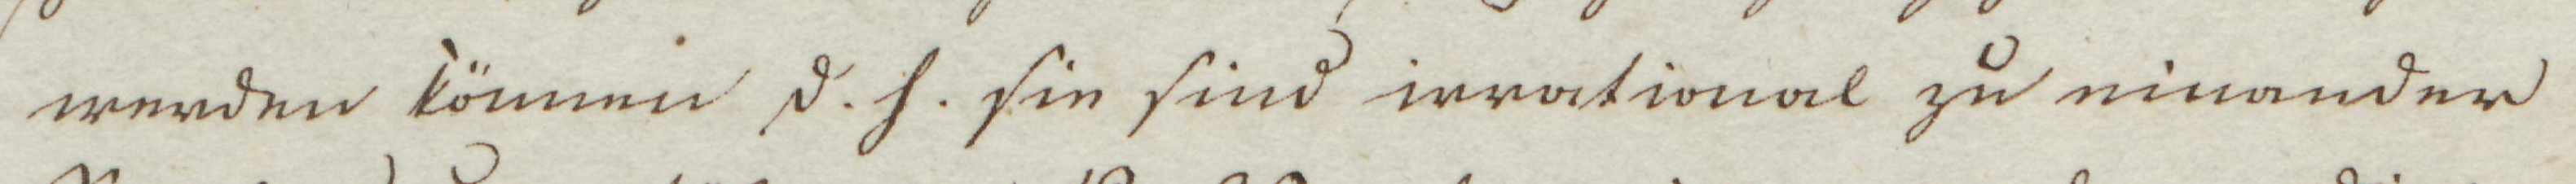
werden können d. h. sie sind irrational zu einander.
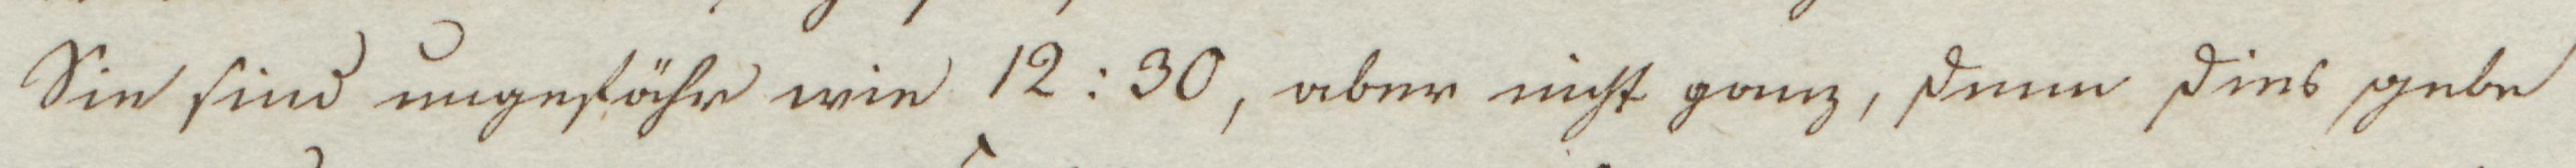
Sie sind ungefähr wie 12 : 30, aber nicht ganz, denn dies gebe
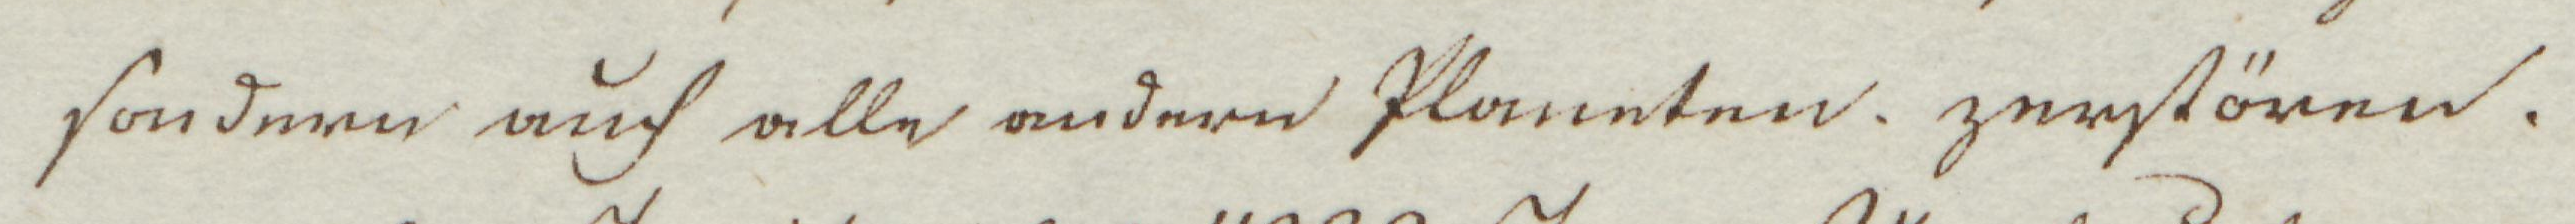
sondern auch alle andern Planeten zerstören.
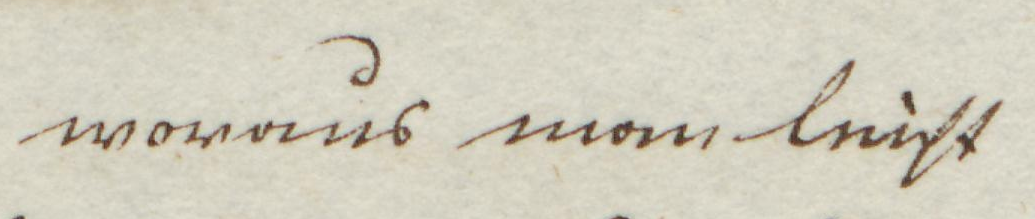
woraus man leicht
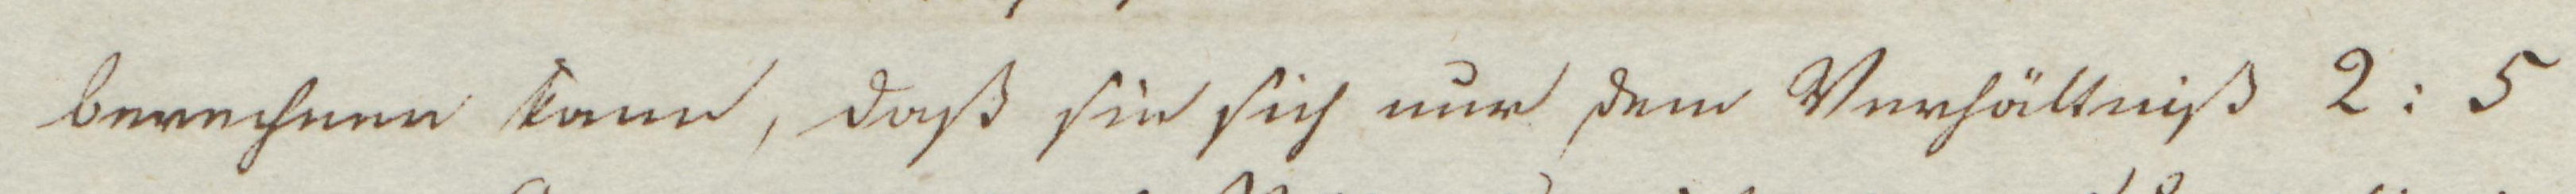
berechnen kann, daß sie sich nur dem Verhältniß 2 : 5
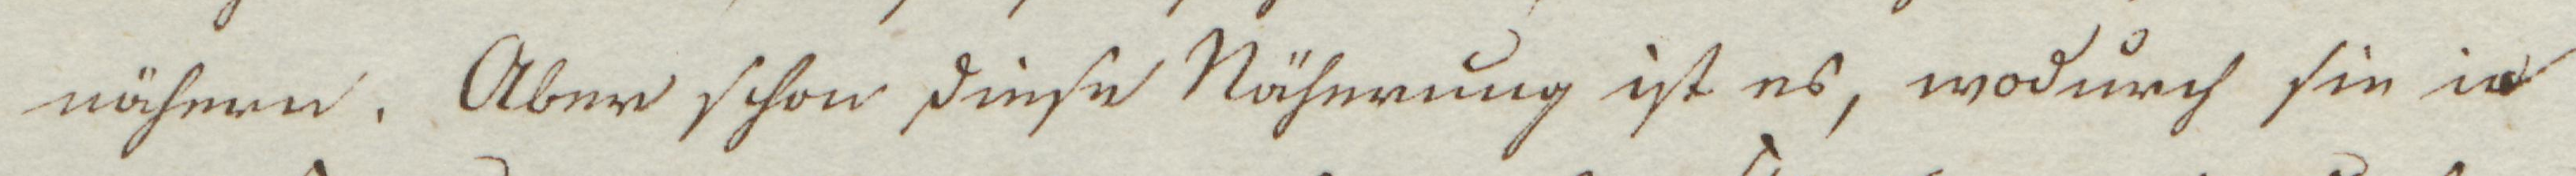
nähern. Aber schon diese Näherung ist es, wodurch sie in
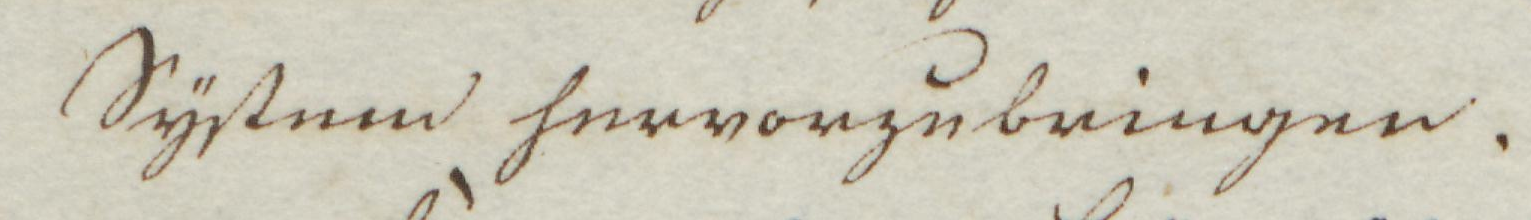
Sÿstem hervorzubringen.
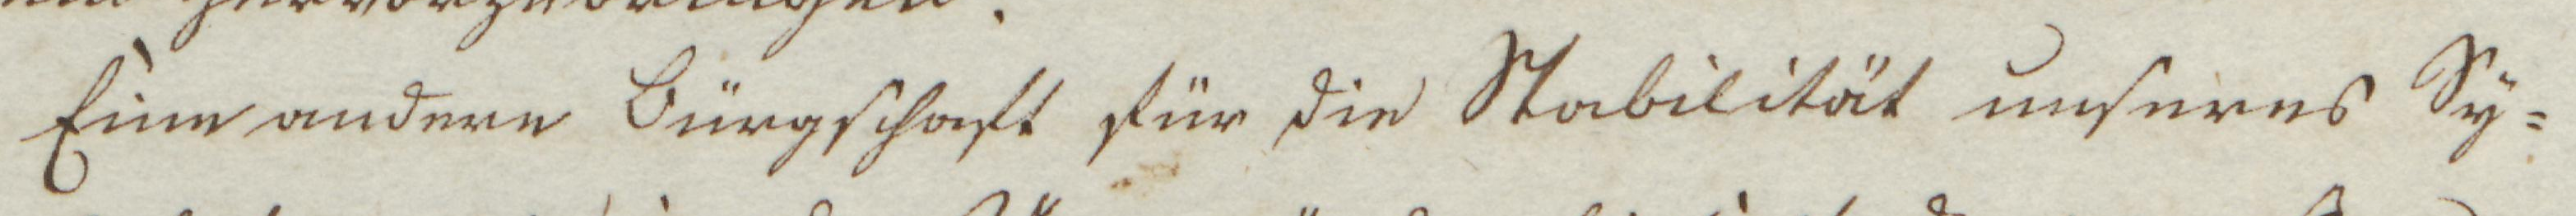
Eine andere Bürgschaft für die Stabilität unseres Sÿ-
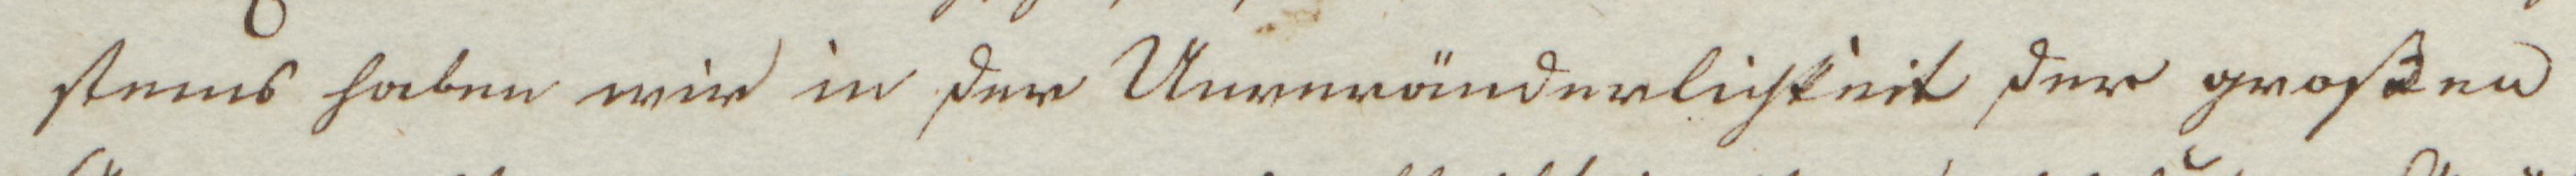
stems haben wir in der Unveränderlichkeit der großen
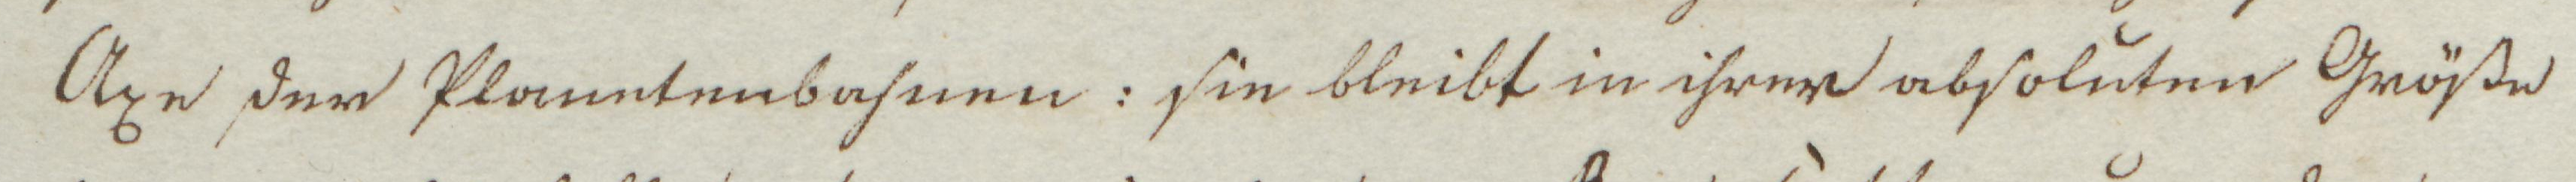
Axe der Planetenbahnen: sie bleibt in ihrer absoluten Größe
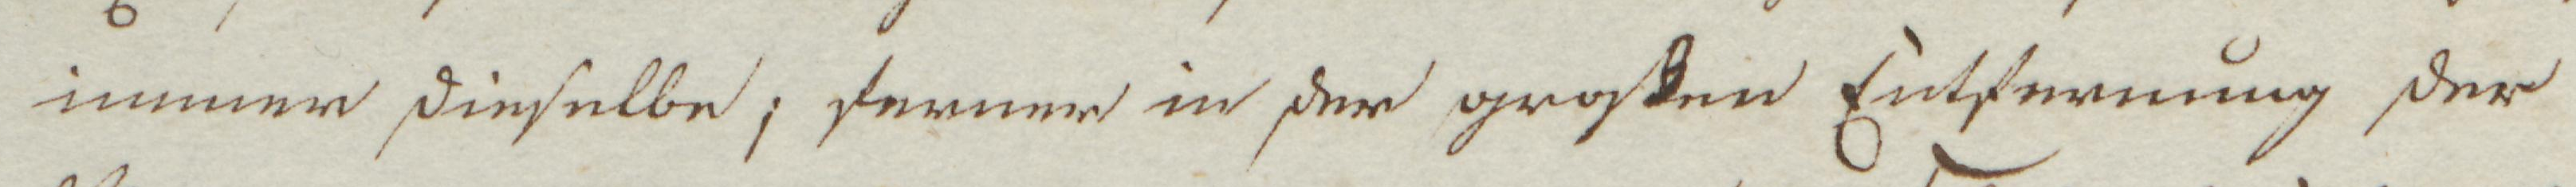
immer dieselbe; ferner in der großen Entfernung der
